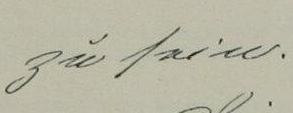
zu sein.
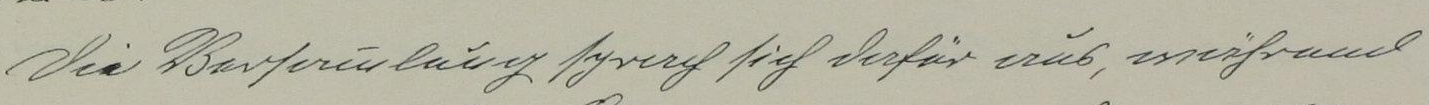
Die Versammlung sprach sich dafür aus, während
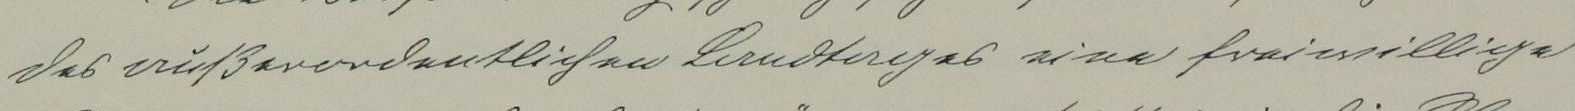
des außerordentlichen Landtages eine freiwillige
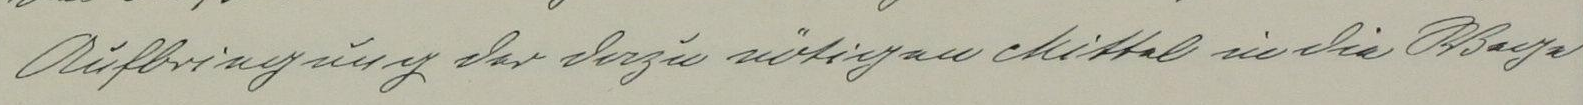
Aufbringung der dazu nötigen Mittel in die Wege
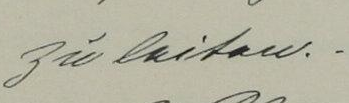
zu leiten.
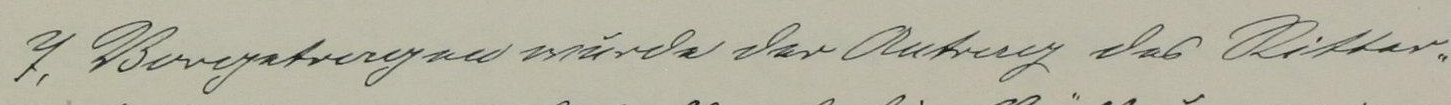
7. Vorgetragen wurde der Antrag des Ritter-
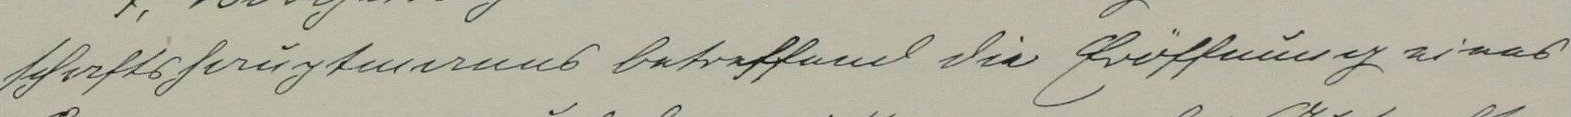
schaftshauptmanns betreffend die Eröffnung eines
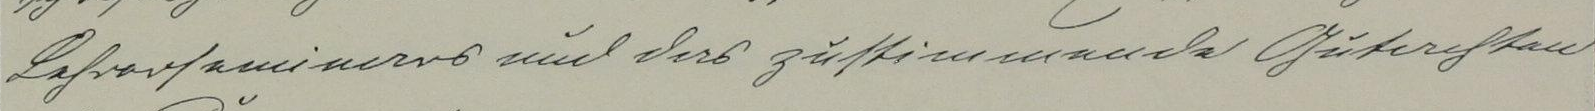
Lehrerseminars und das zustimmende Gutachten
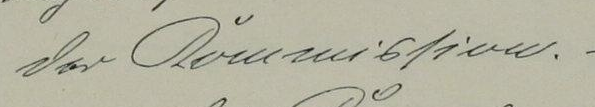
der Kommission.
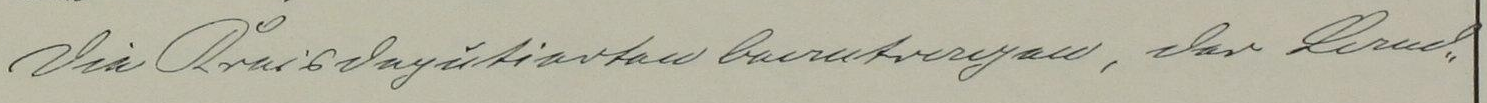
Die Kreisdeputierten beantragen, der Land-
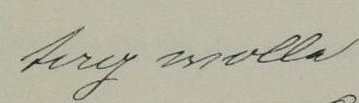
tag wolle
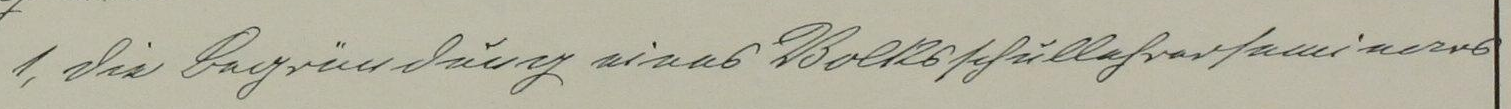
1. die Begründung eines Volksschullehrerseminars
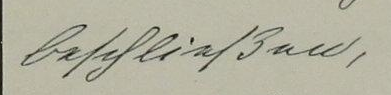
beschließen,
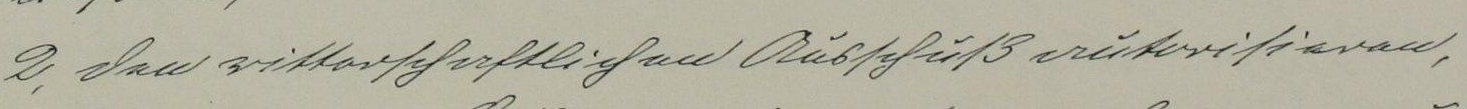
2. den ritterschaftlichen Ausschuß autorisieren,
